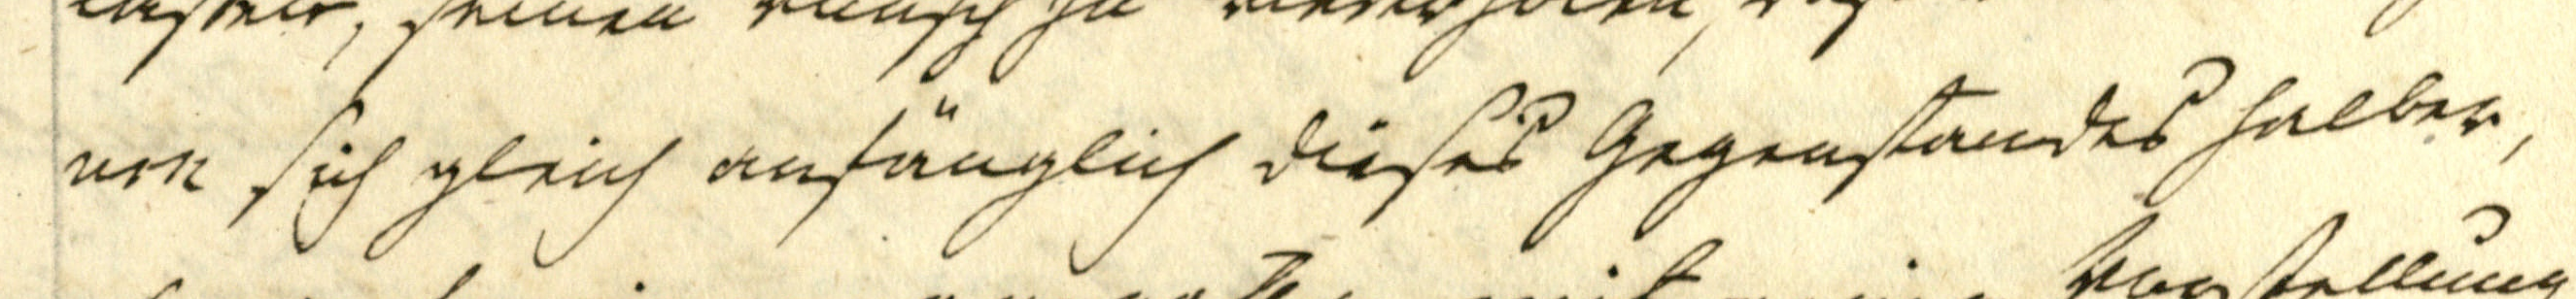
um sich gleich anfänglich dieses Gegenstandes halber,
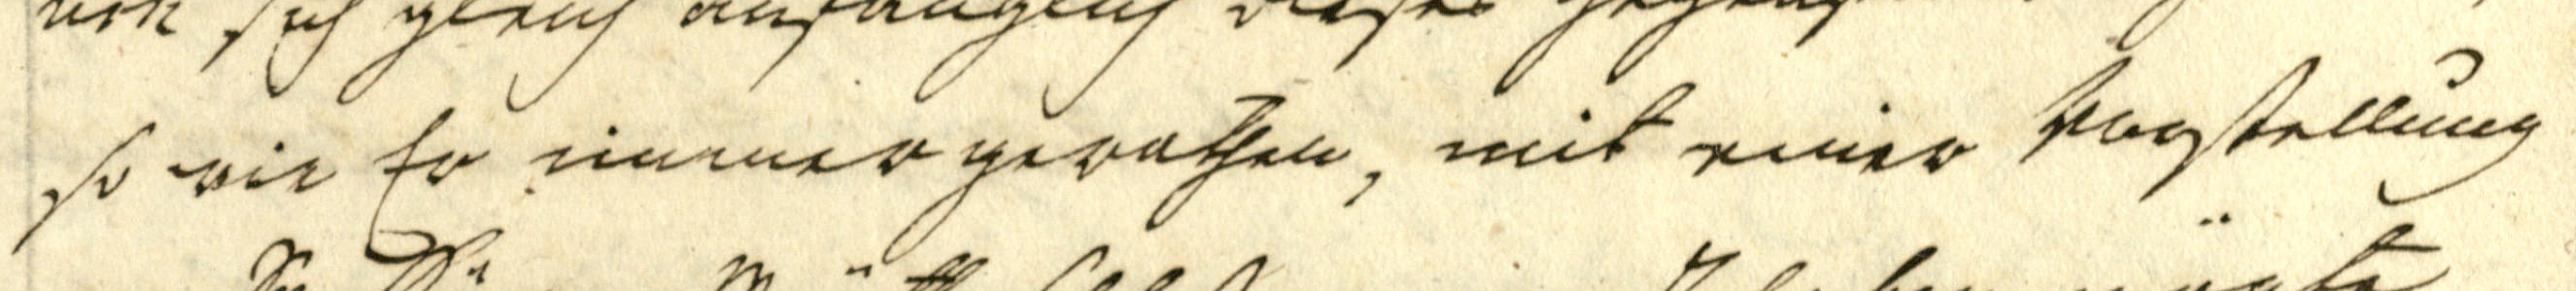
so wie Er immer gerathen, mit einer Vorstellung
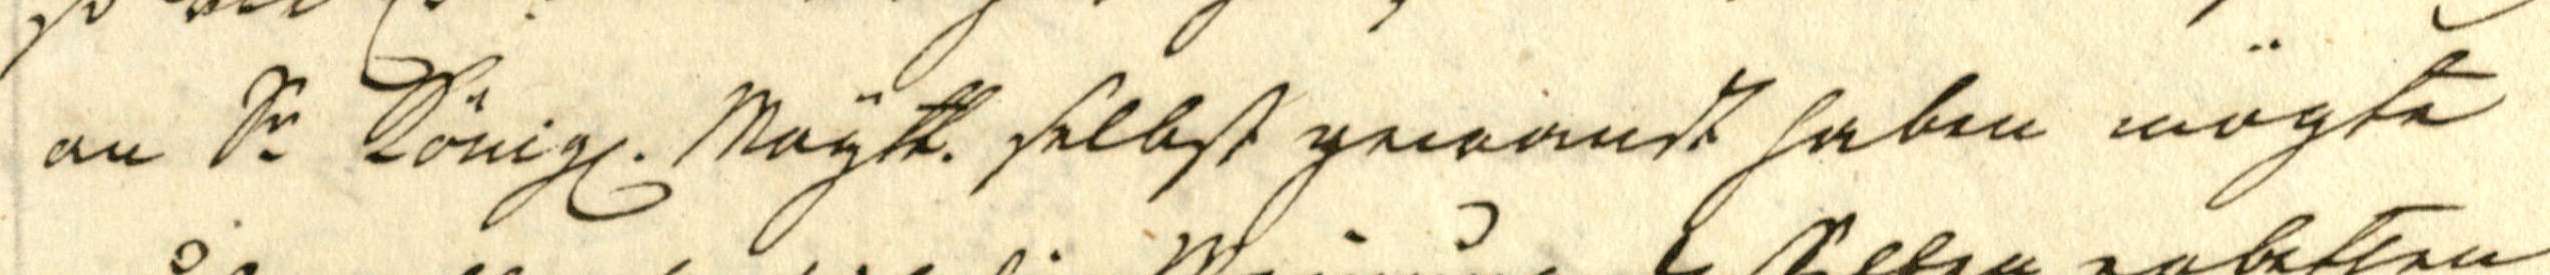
an Sr Königl. Maÿtt. selbst gewandt haben mögte
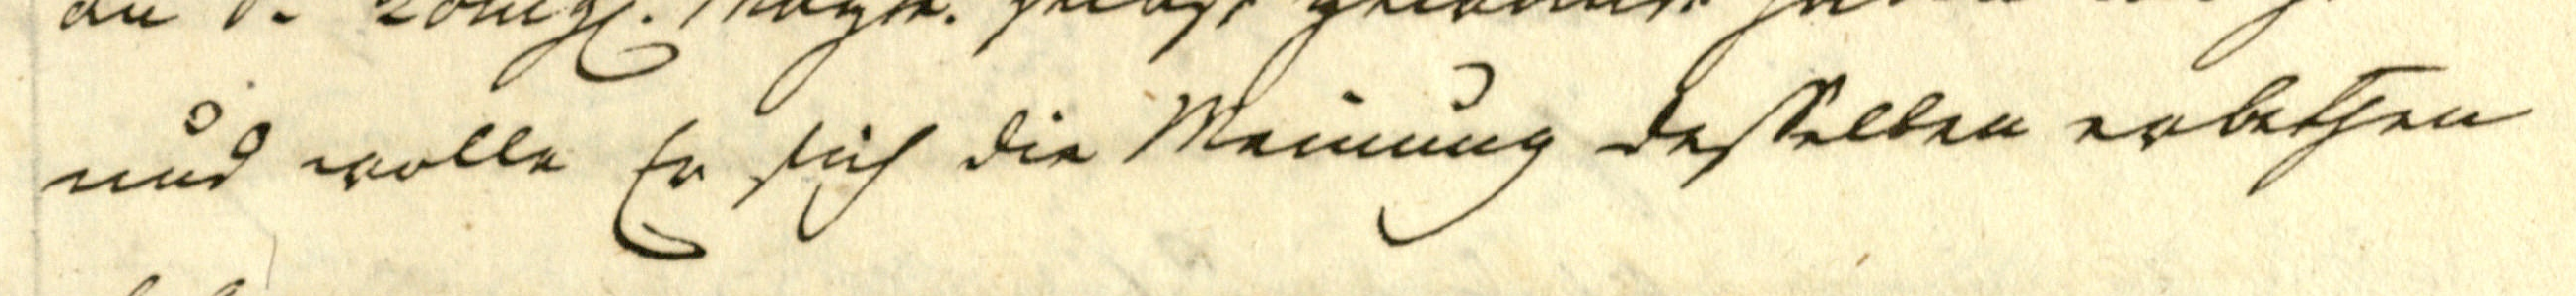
und wolle Er sich die Meinung desselben erbethen
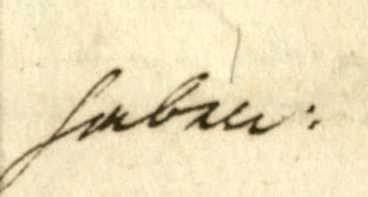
haben:
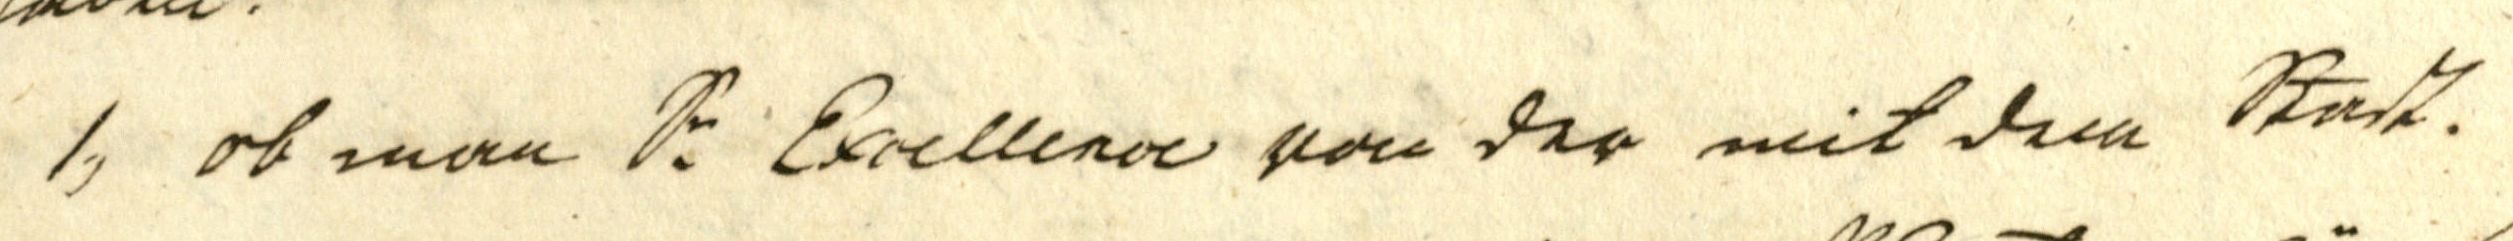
1., ob man Sr Excellence von der mit dem Stadt¬
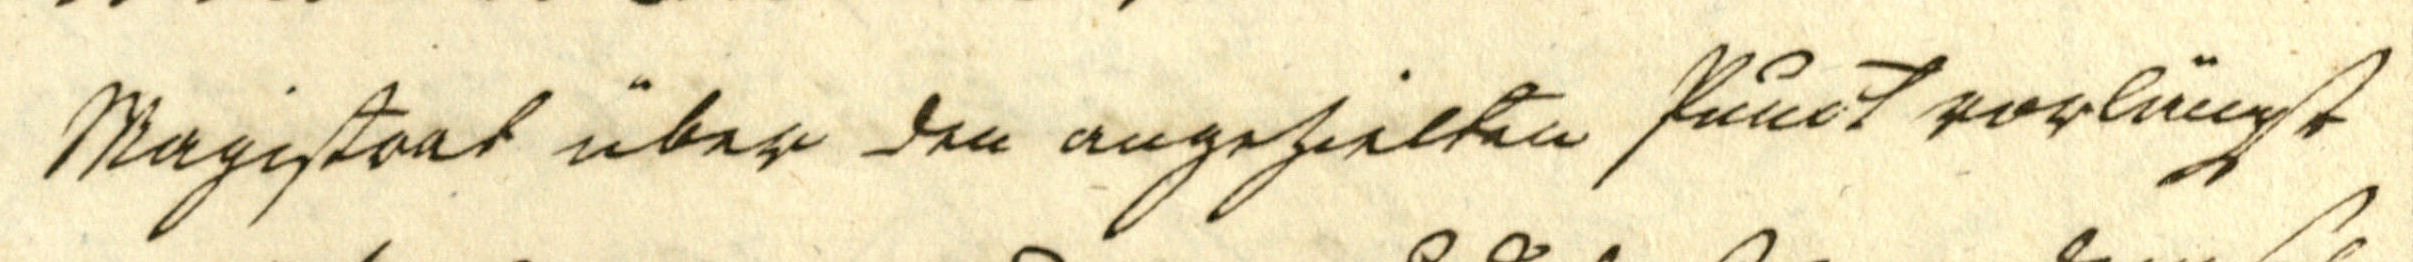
Magistrat über den angezielten Punct vorlängst
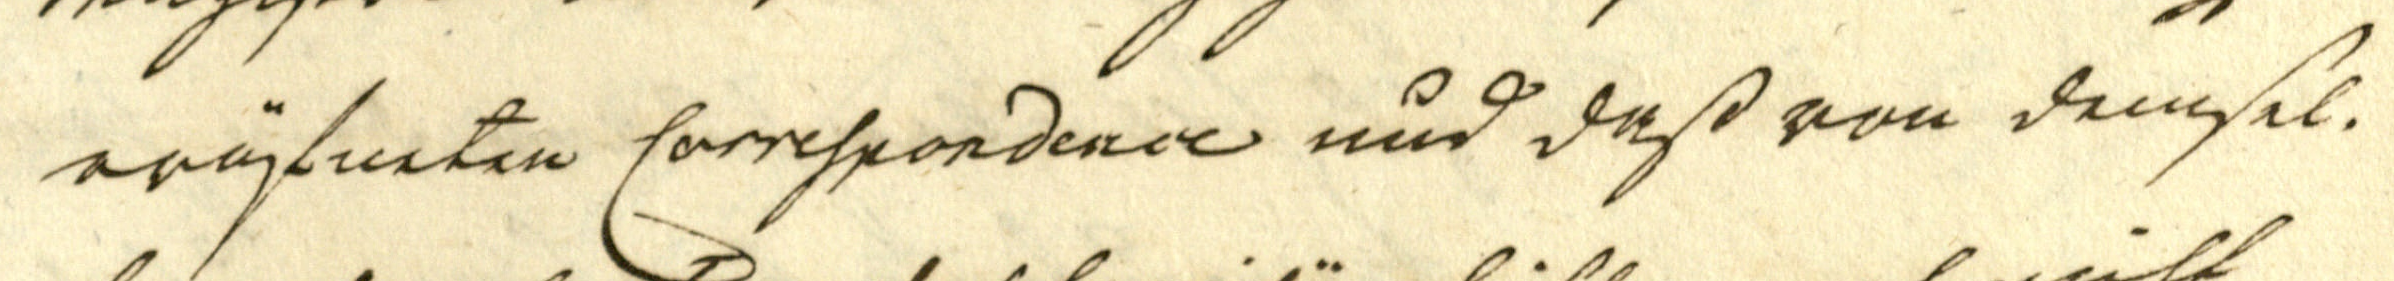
eröfneten Correspondence und daß von demsel¬
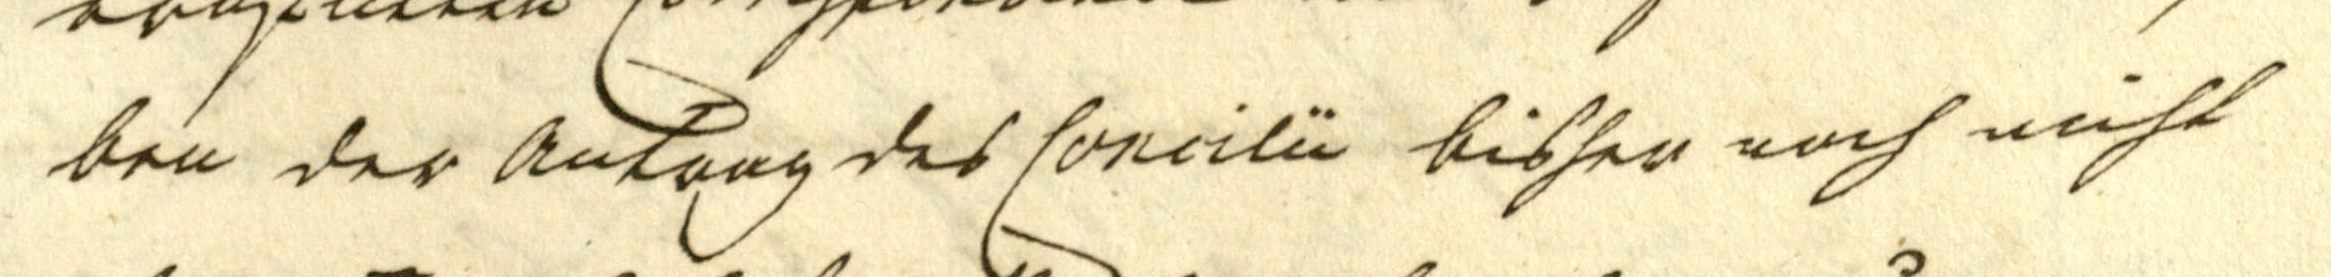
ben der Antrag des Concilii bisher noch nicht
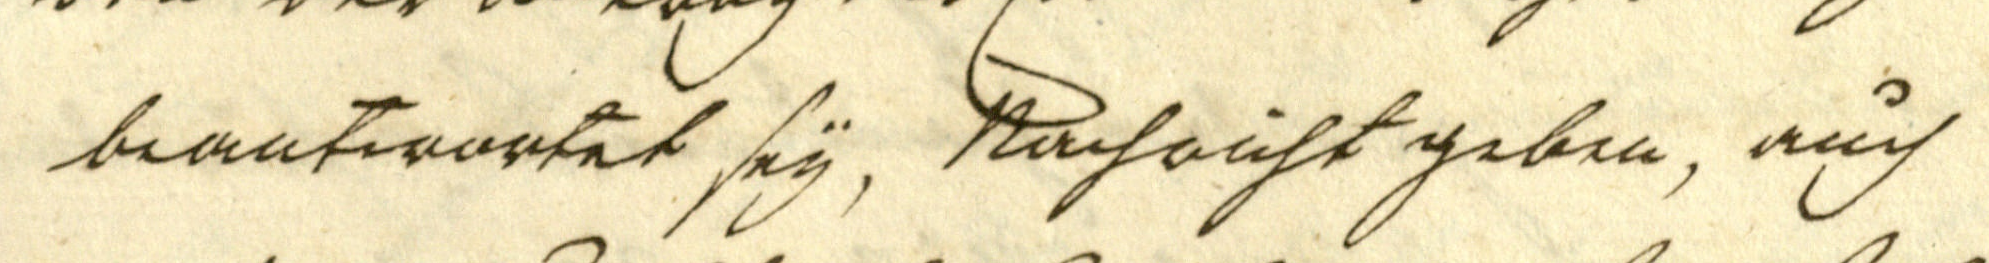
beantwortet seÿ, Nachricht geben, auch
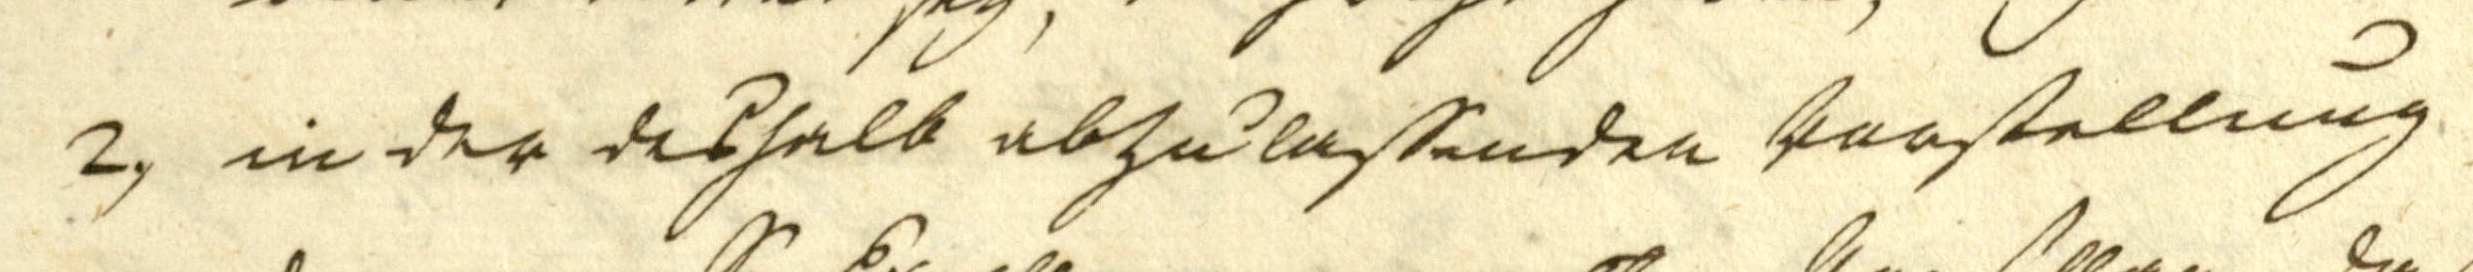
2., in der deshalb abzulassenden Vorstellung
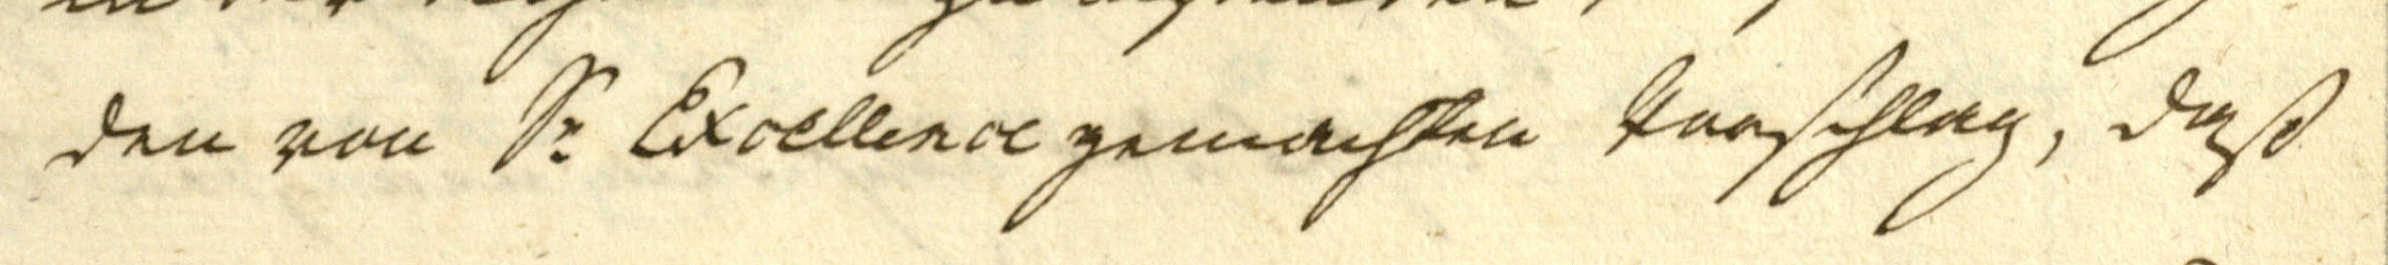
den von Sr Excellence gemachten Vorschlag, daß
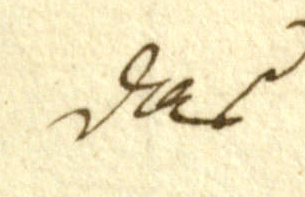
das
